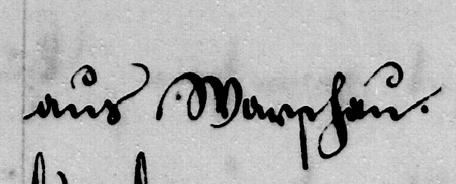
aus Warschau.
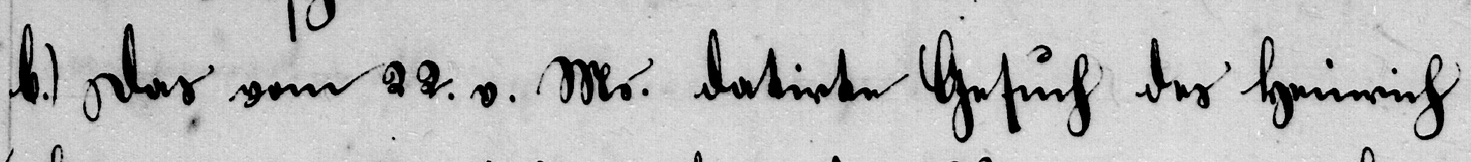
b.) Das vom 22. v. Ms. datirte Gesuch des Heinrich
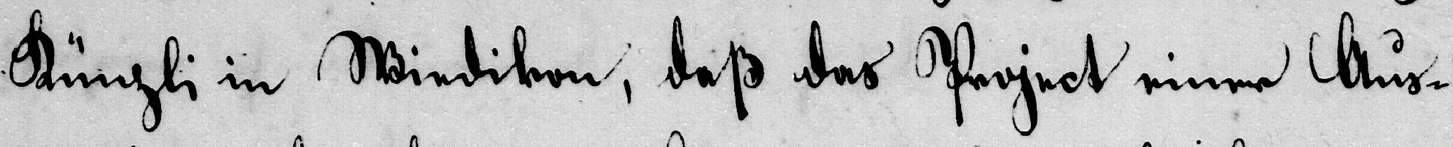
Künzli in Wiedikon, daß das Project einer Aus¬
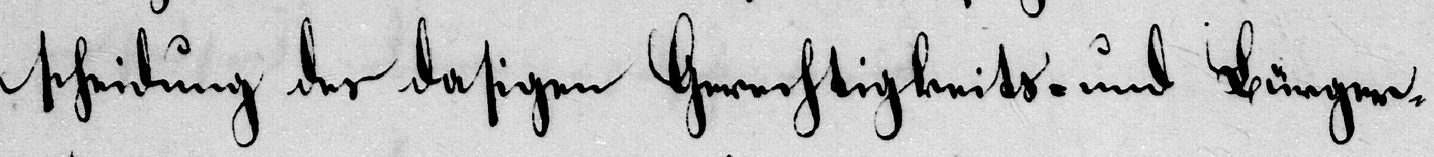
scheidung des dasigen Gerechtigkeits- und Bürger¬
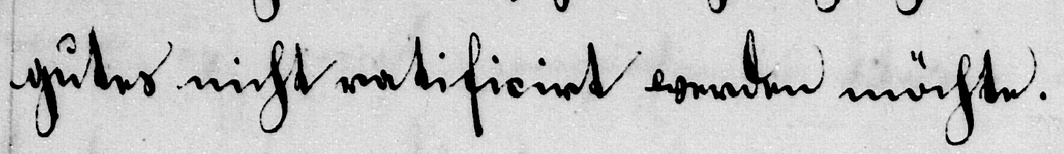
gutes nicht ratificirt werden möchte.
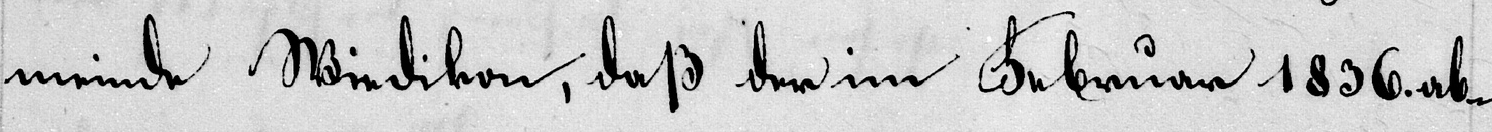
meinde Wiedikon, daß der im Februar 1836. ab¬
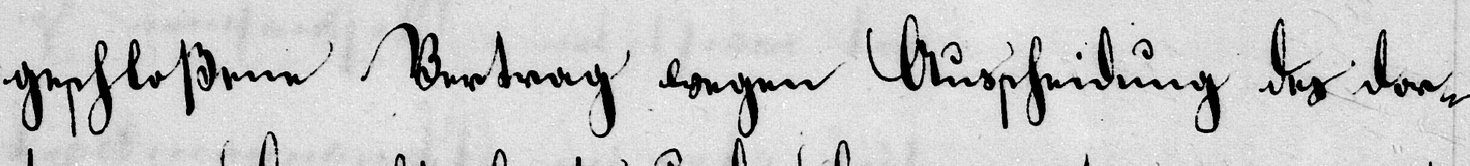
geschloßene Vertrag wegen Ausscheidung des dor¬
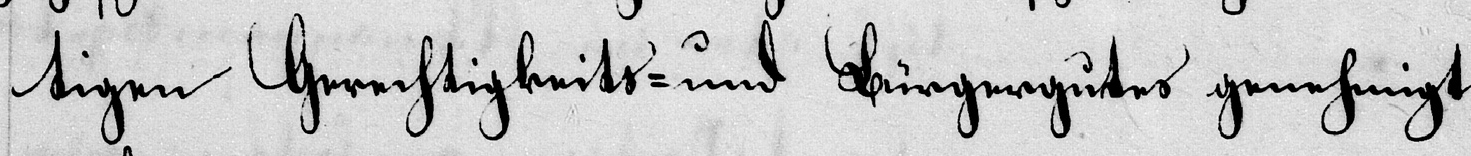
tigen Gerechtigkeits- und Bürgergutes genehmigt
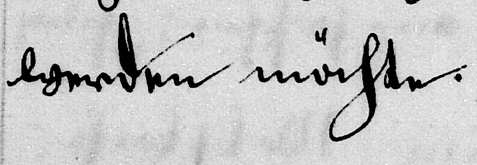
werden möchte.
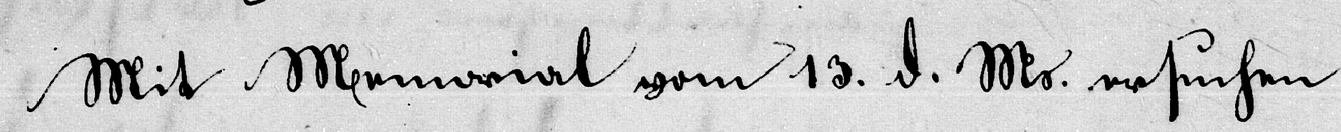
Mit Memorial vom 13. d. Ms. ersuchen
